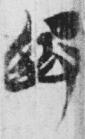臤（賢）
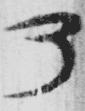乃
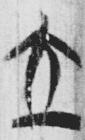立
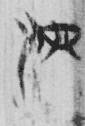泗（伊）
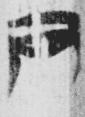尹
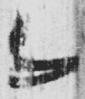㠯（以）
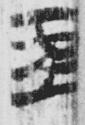爲
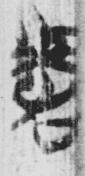差（佐）
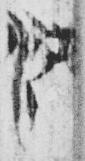泗（伊）
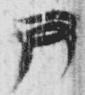尹
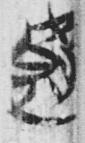既
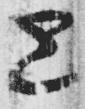已
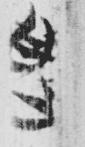受
